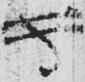于
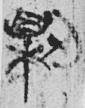{臬刀}（臬危）
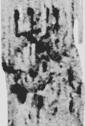帶（卼）
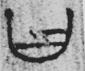曰
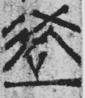迖（動）
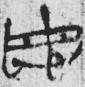○（悔）
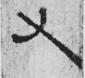又
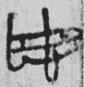悔
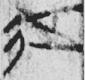征
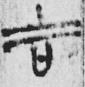吉
